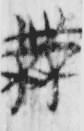無
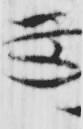正
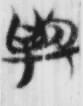與
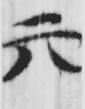亓（其）
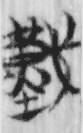○（勤）
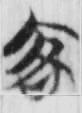客
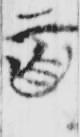百
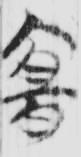宜
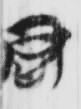君
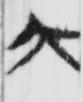大
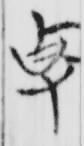史
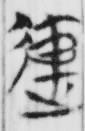連
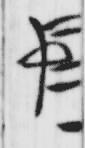𠁩
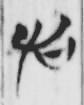左
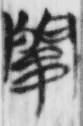○（關）
